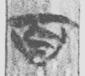百
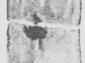十
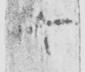七
